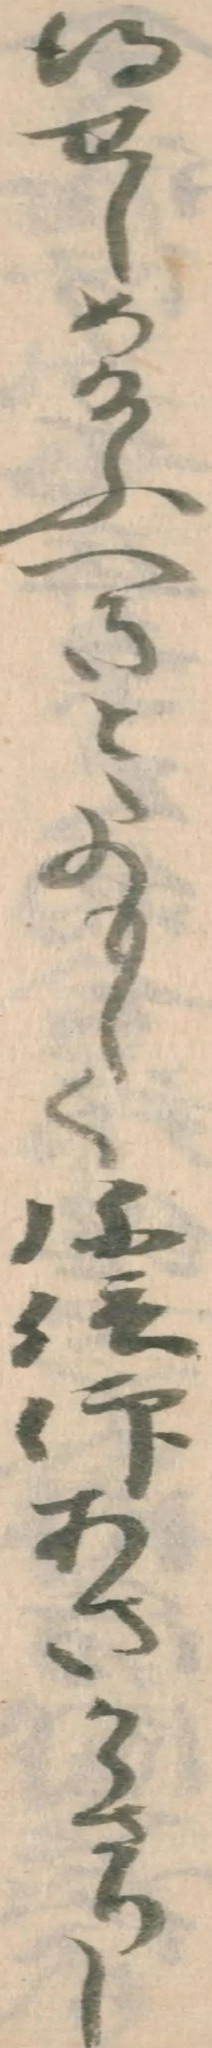得せしめ給ふへきとたのもしく弥信仰あさからさりし
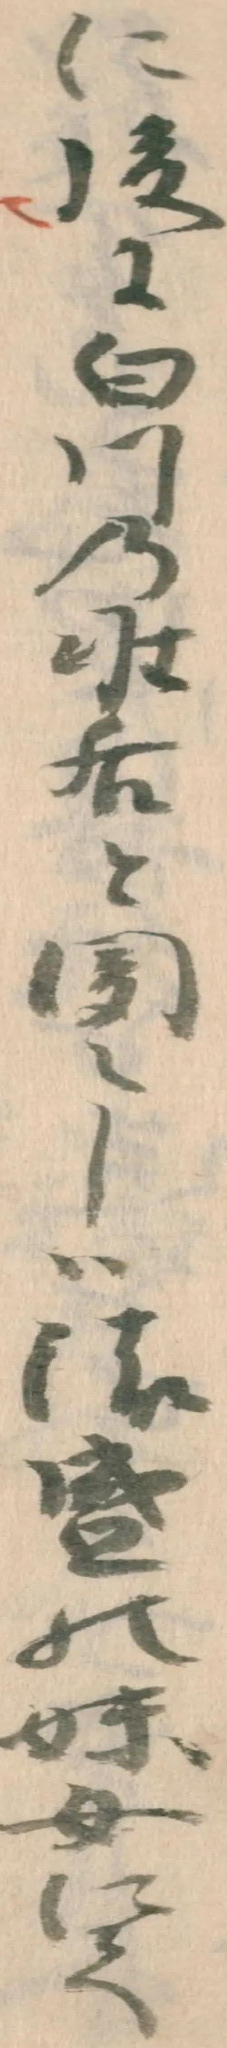に後に白川の准后と聞えしは清盛の妹女にて
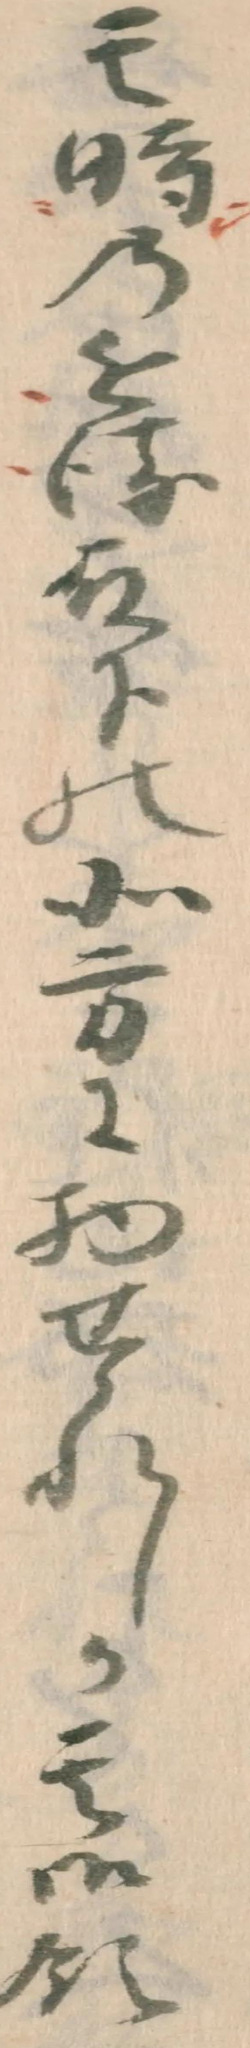其時゛の近衛殿下の北方に物せられしか其御領
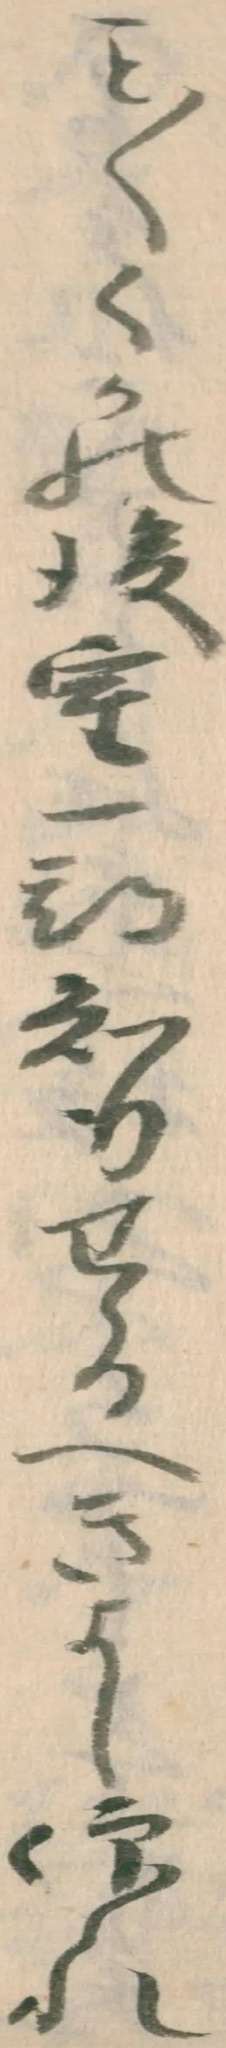こと〳〵くかの後室一期知行せらるへきよし仰られ
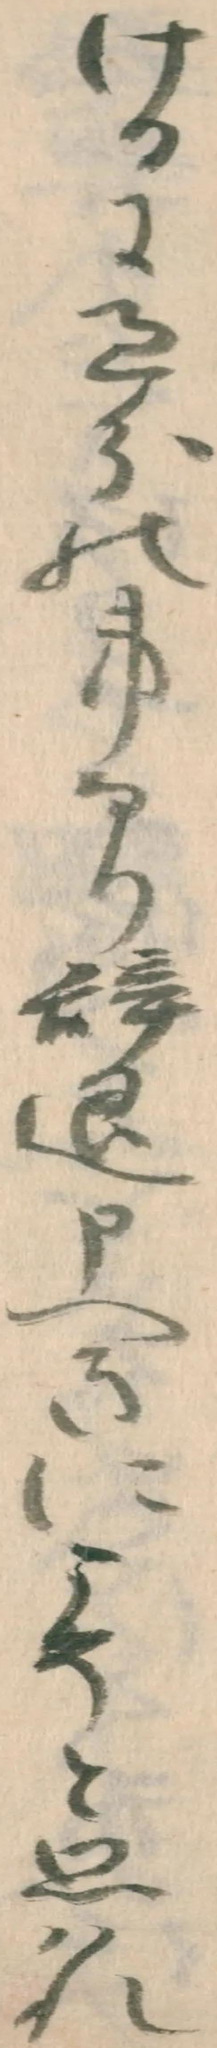けるに過分の事なり辞退申へきにこそと思はれ
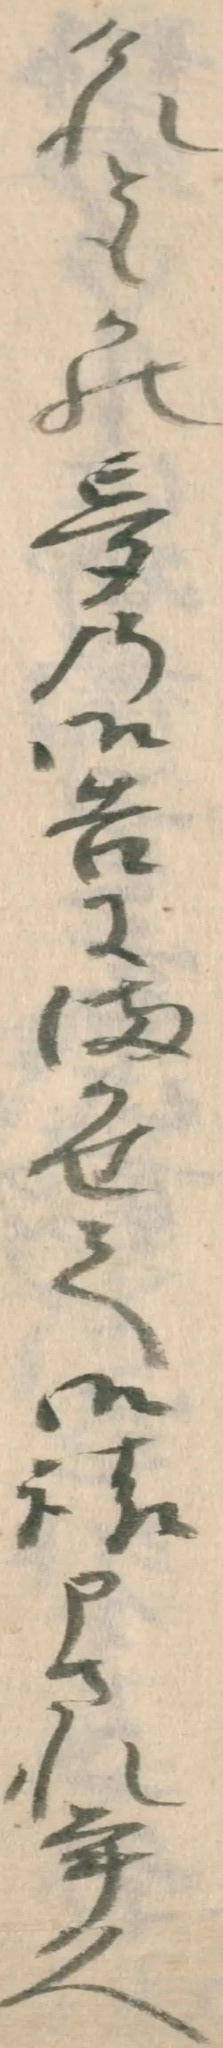けれともかの夢の御告にまかせて御請申され年久
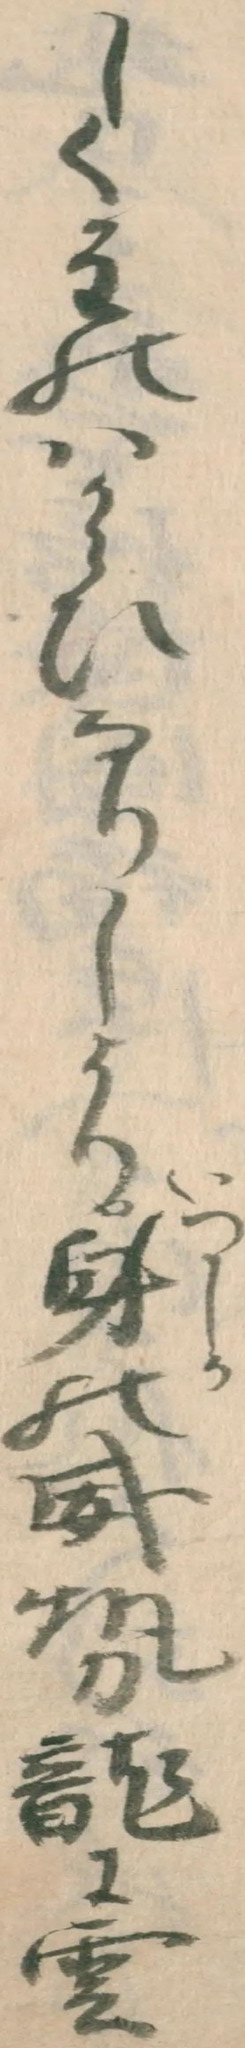しく主のはからひなりしより◦身の威勢龍に雲
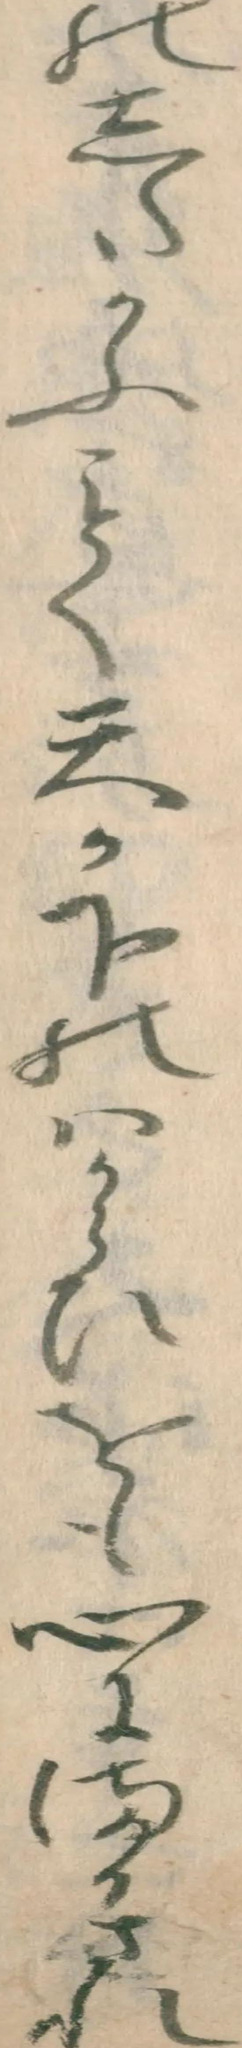のしたかふことく天か下のはからひをも心にまかされ

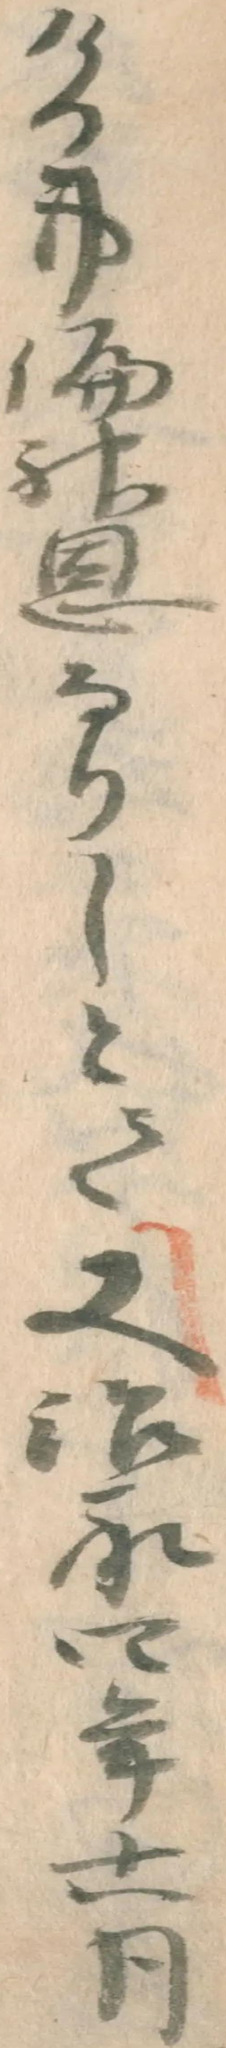ける事偏神恩なりしと云々又治承四年六月
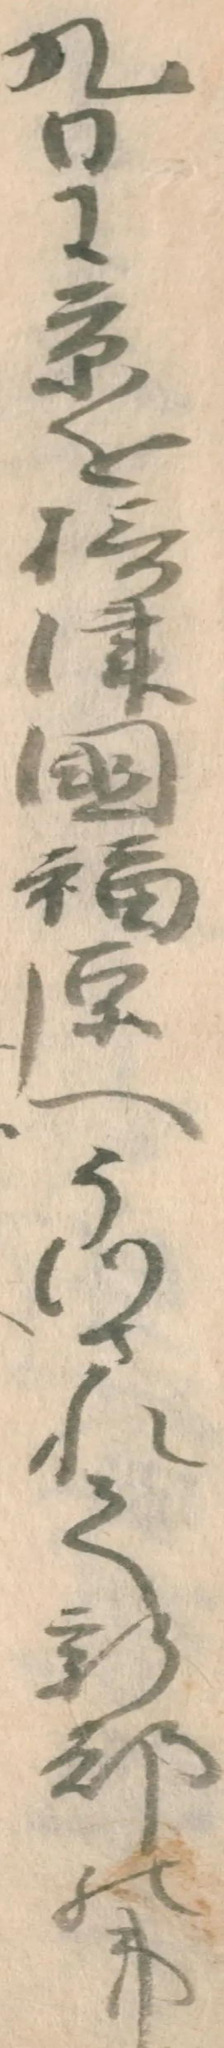九日に京を摂津国福原へうつされて新都の事
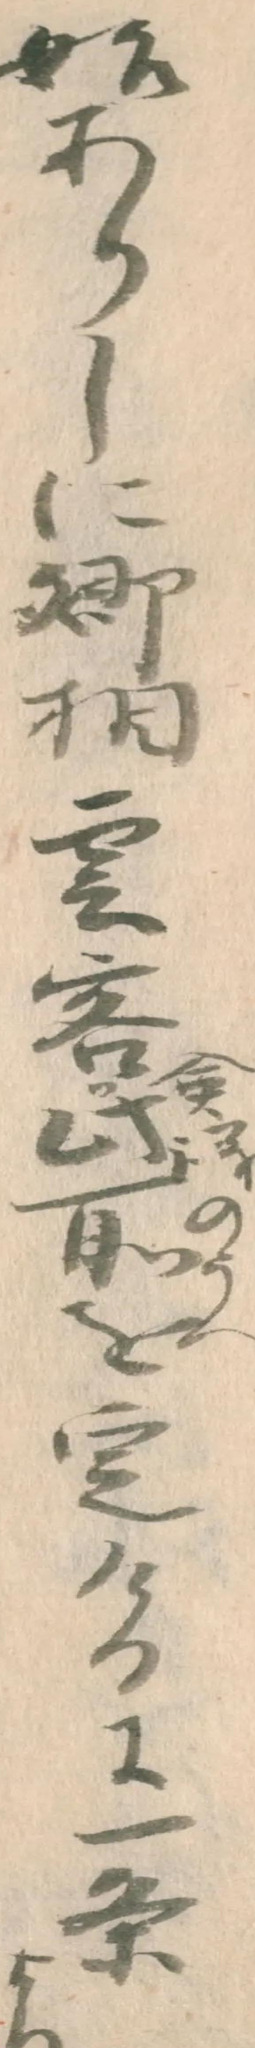始ありしに卿相雲客◦此所を定けるに一条より
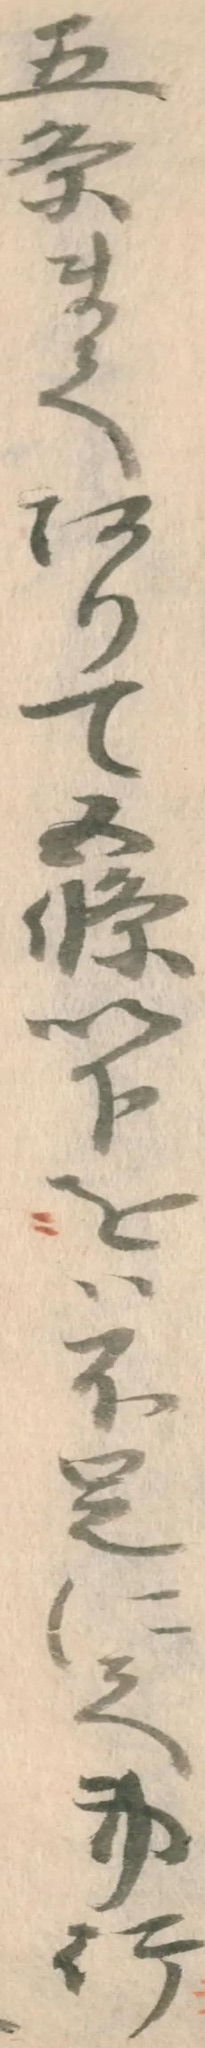五条まてありて五条以下をは不足にて事行
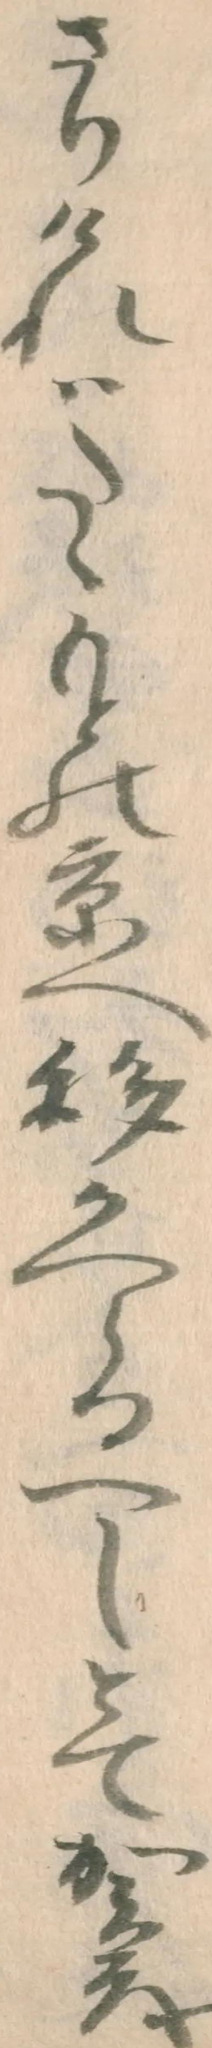さりけれはたゝもとの京へ移かへらるへしとて賀茂
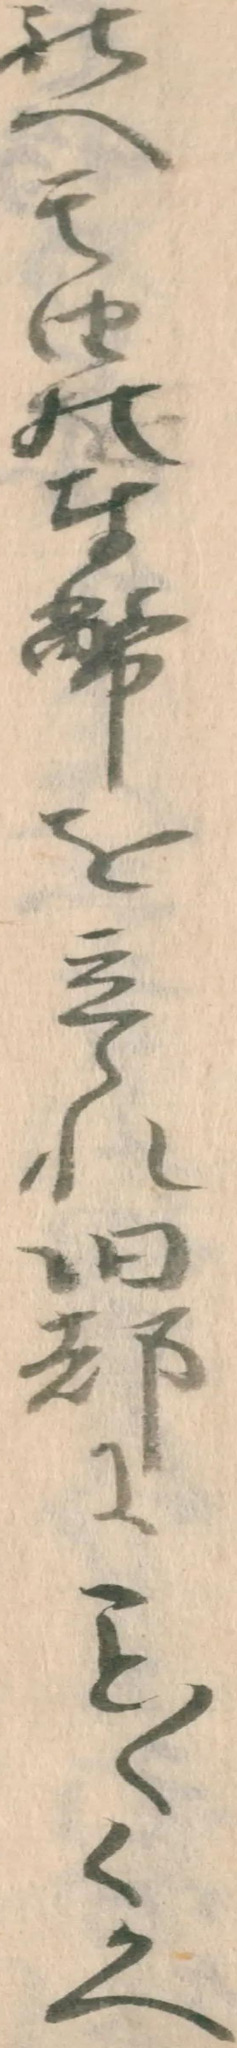社へ其由の奉幣を立られ旧都にこと〳〵くかへ
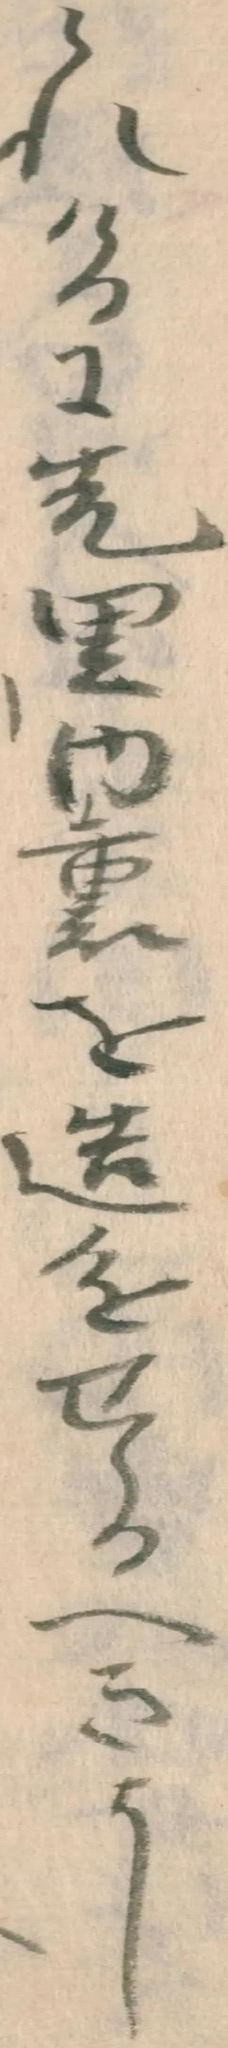られけるに先里-内裏を造進せらるへきよし
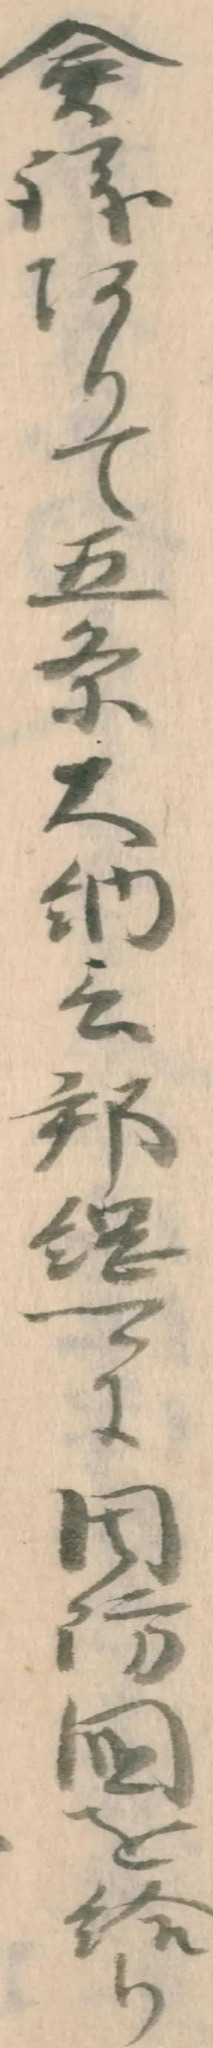僉議ありて五条大納言邦綱卿に周防国を給り
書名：賀茂社記録. 第1冊
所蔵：国立国会図書館 National Diet Library, JAPAN
